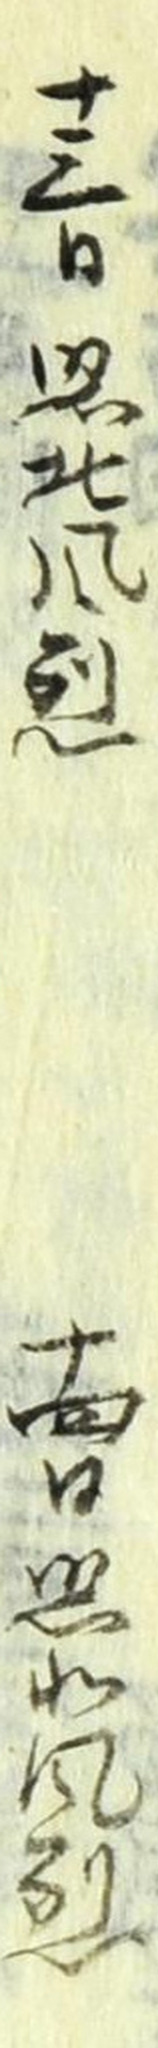十三日照北風烈十四日照北風烈
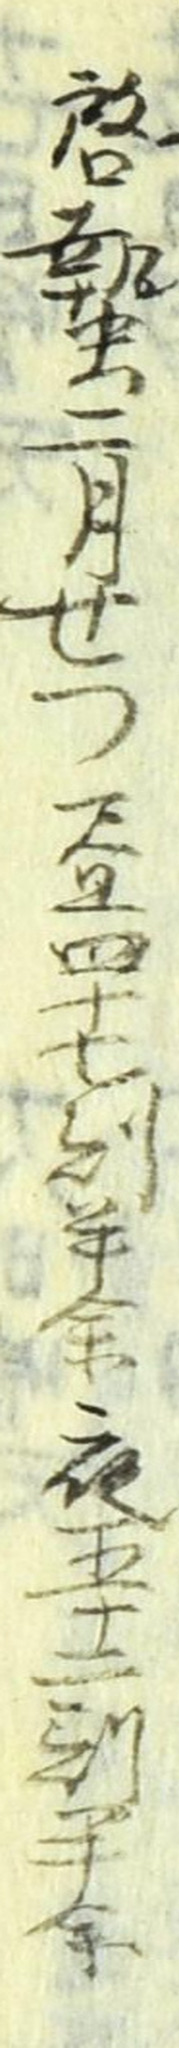啓蟄二月せつ昼四十七刻半余夜五十二刻半余
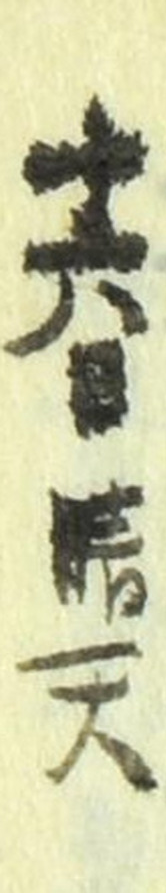十六日晴天

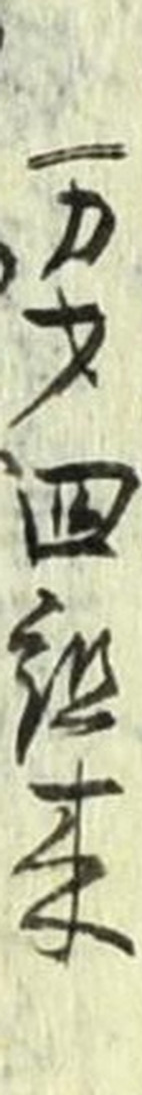万才四組来
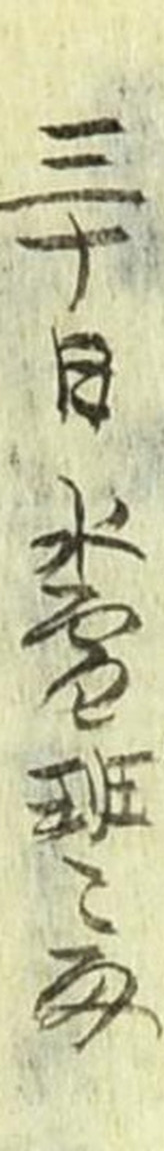三十日水雪班々雨
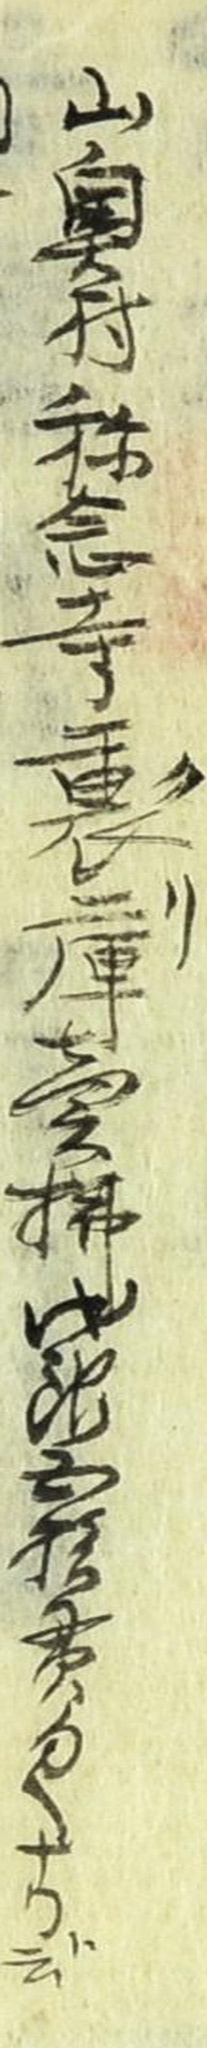山奥村称念寺裏庫売払代銀五拾貫匁ナリト云
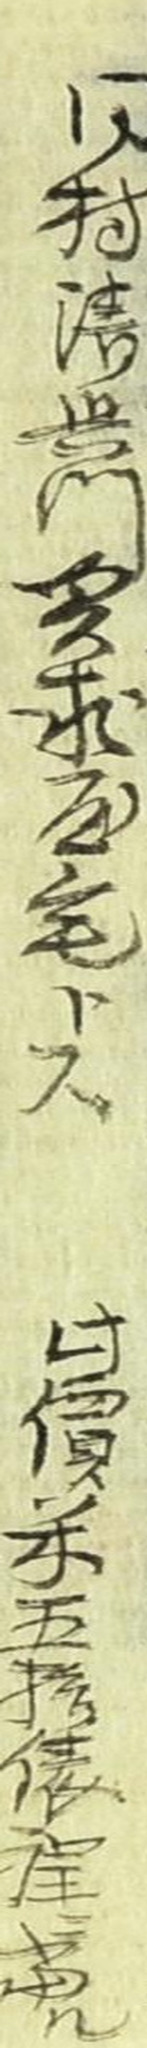同村清與門買求屋宅トス此価米五拾俵程ニ当ル
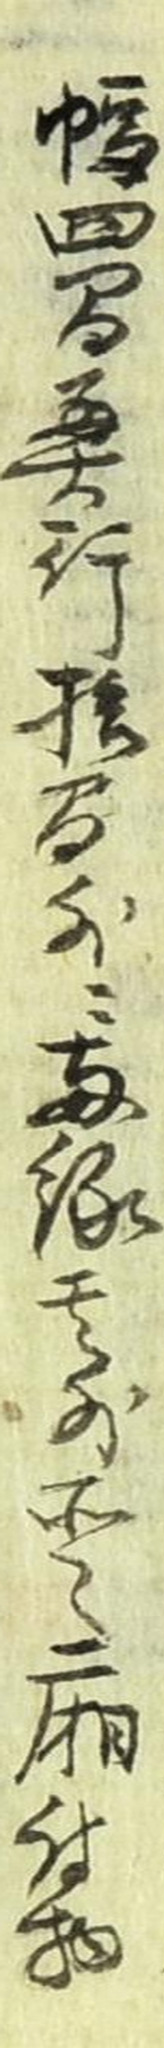幅四間奥行拾間外ニ雨縁其外所々廂付物
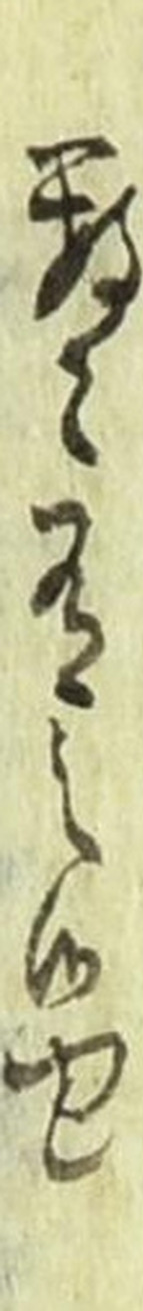数々有之候由

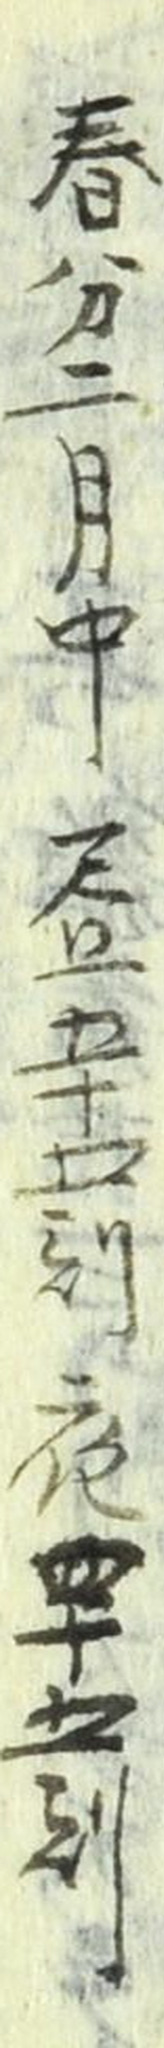春分二月中昼五十五刻夜四十五刻
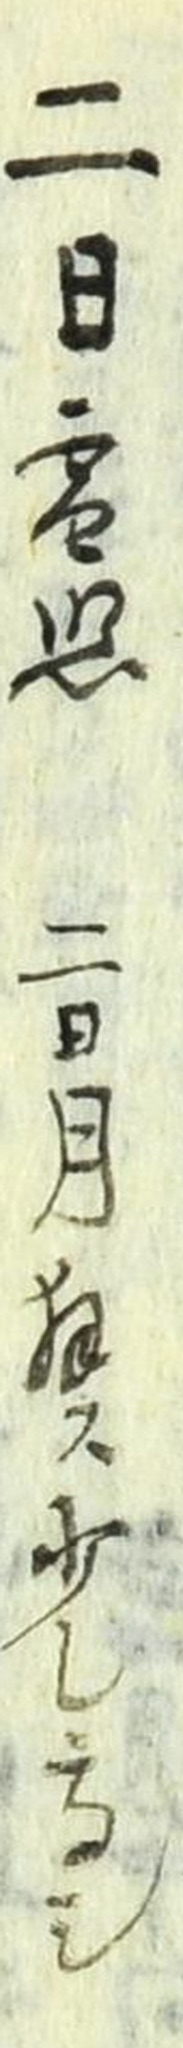二日雪照二日月拝ス少シ高ス
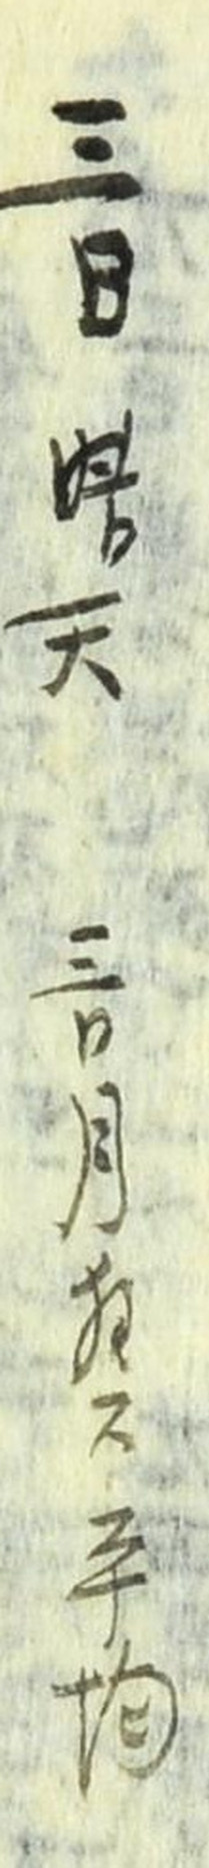三日晴天三日月拝ス平均
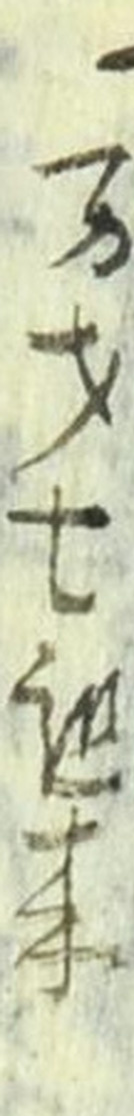万才七組来
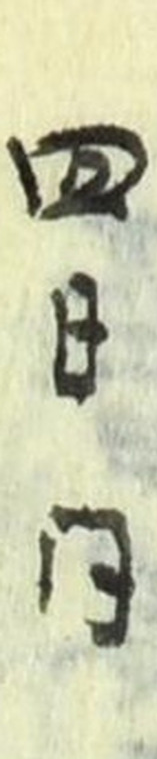四日同
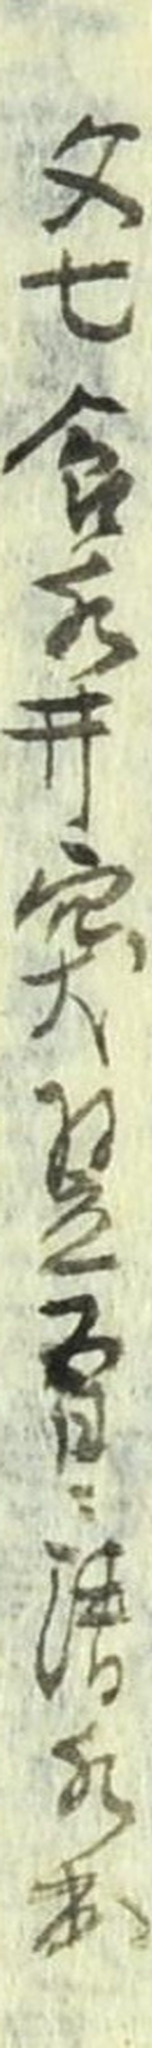文七食水井突翌五日ニ清水出
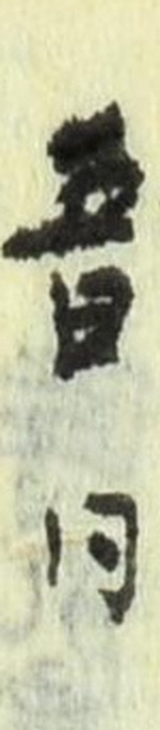五日同
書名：（日記）
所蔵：福井県文書館 Fukui Prefectural Archives
